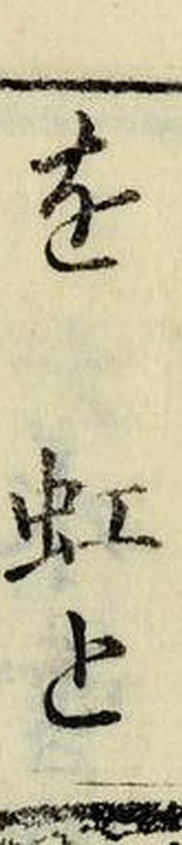を虹と
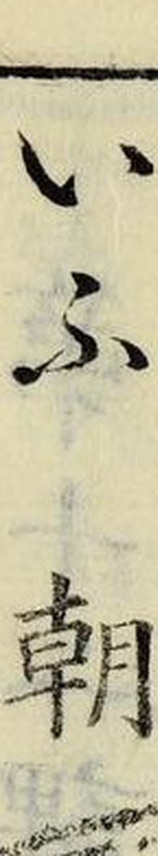いふ朝
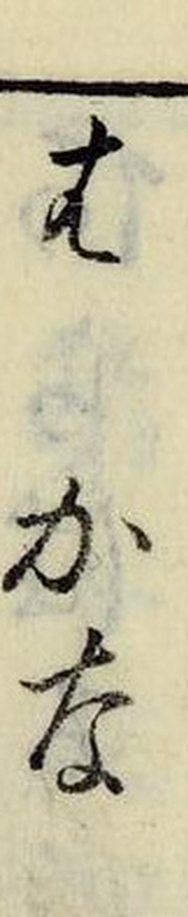はかな
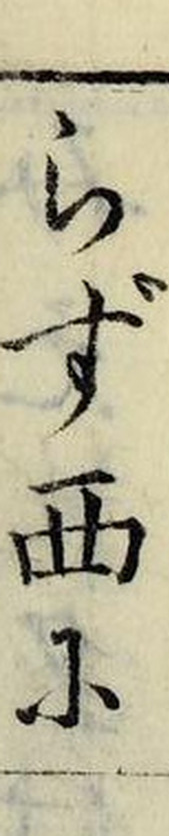らず西に

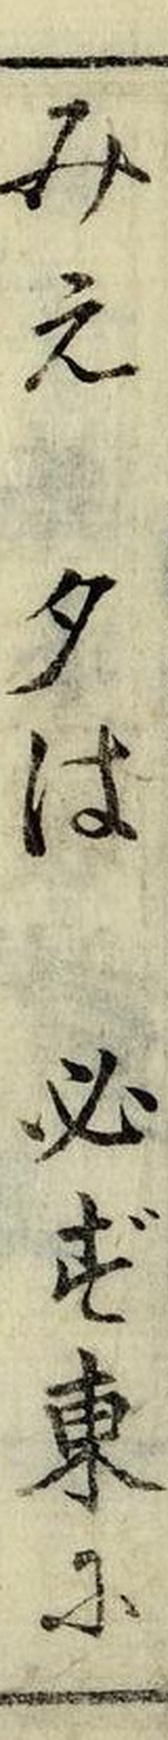みえ夕は必ず東に
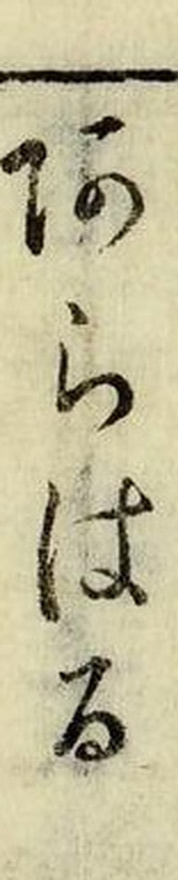あらはる
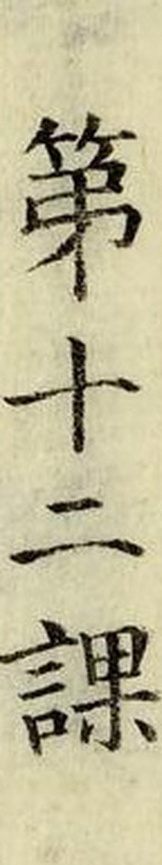第十二課
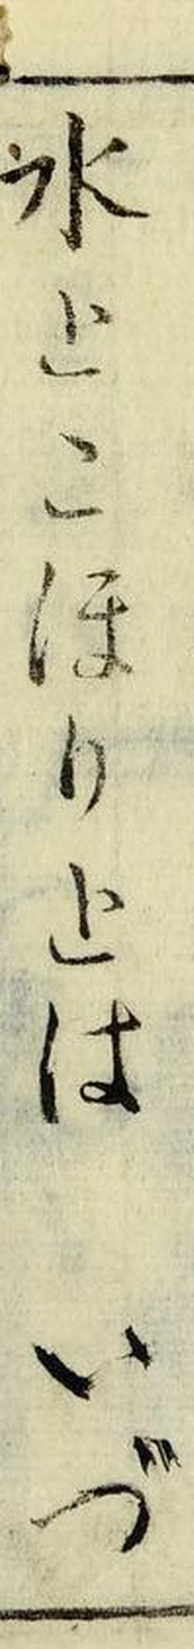水とこほりとはいづ
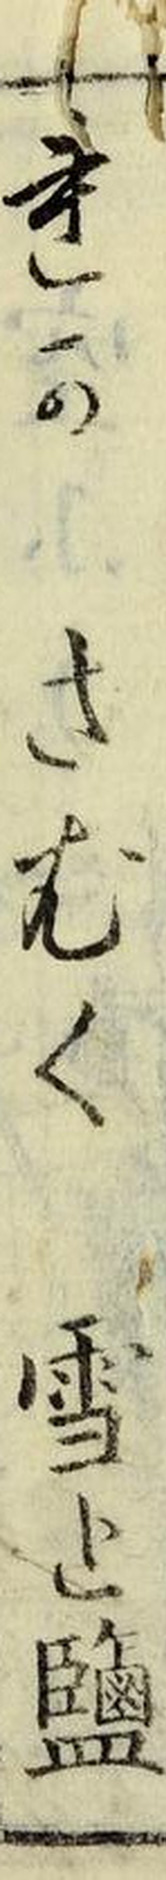れかさむく雪と塩
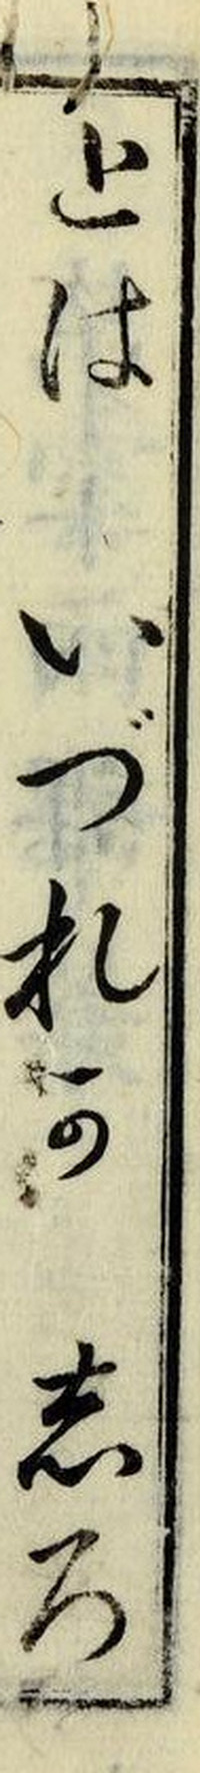とはいづれかしろ
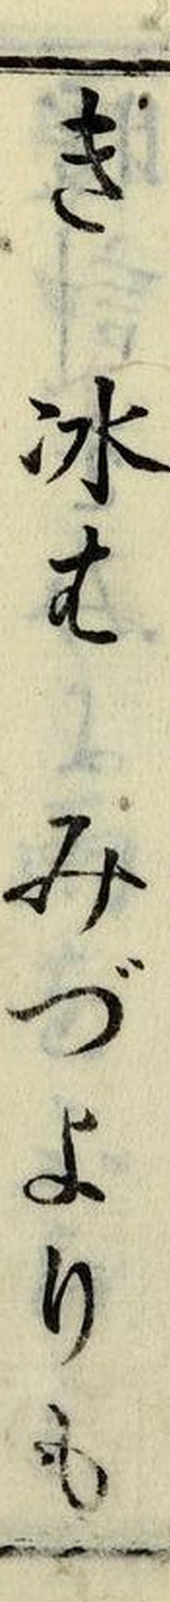き氷はみづよりも
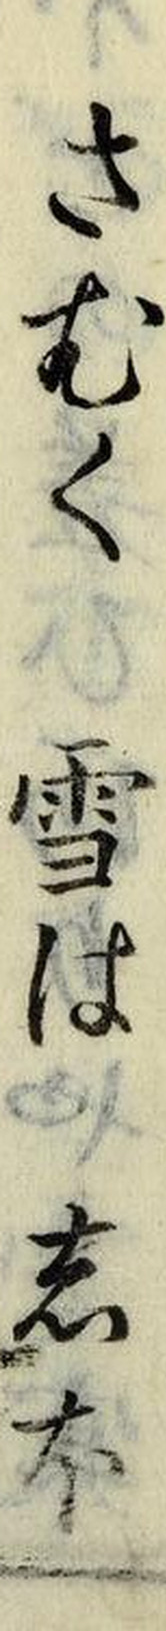さむく雪はしほ
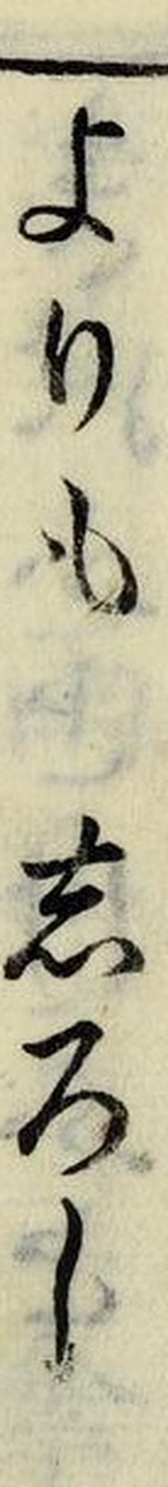よりもしろし
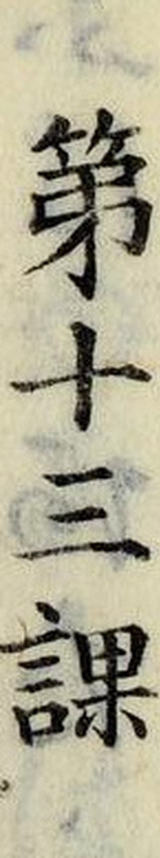第十三課
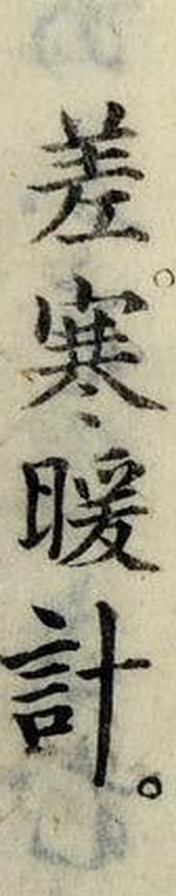差。寒暖計。

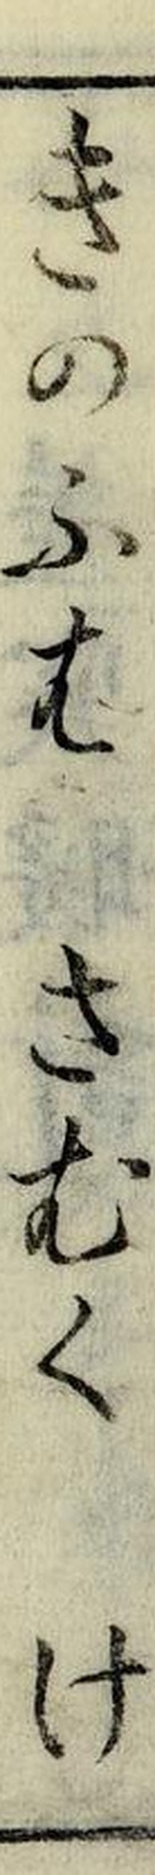きのふはさむくけ
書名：小学読本 初等科 巻一
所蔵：福井県文書館 Fukui Prefectural Archives
